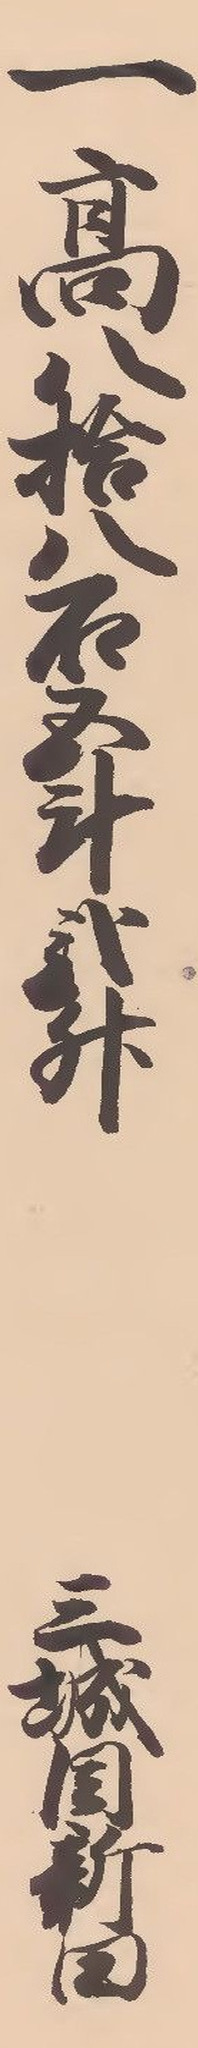一高八拾八石五斗弐升三城目新田
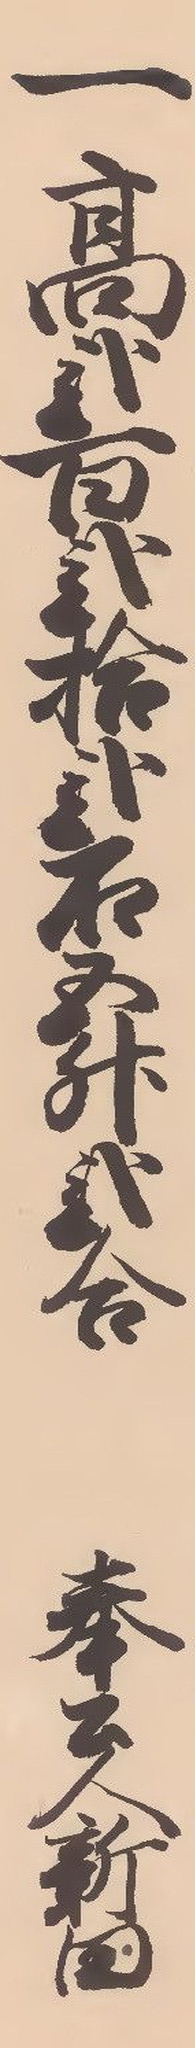一高弐百弐拾弐石五升弐合奉公人新田
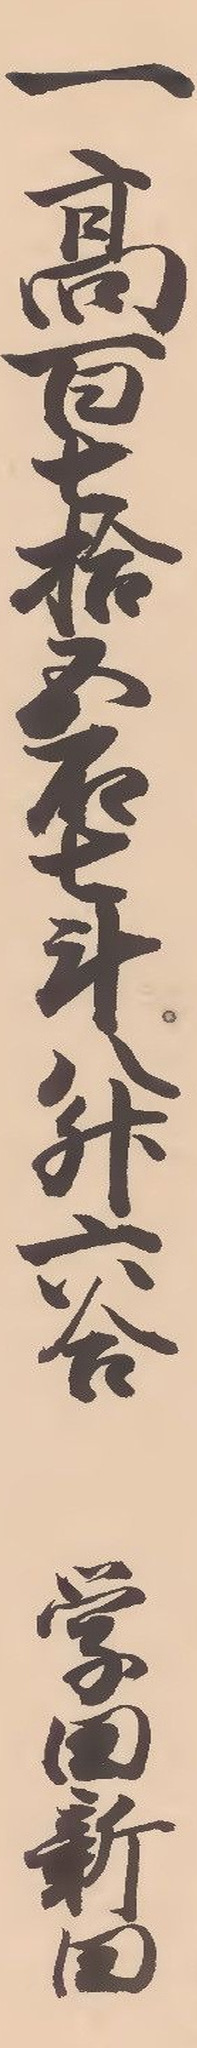一高百七拾五石七斗八升六合学田新田
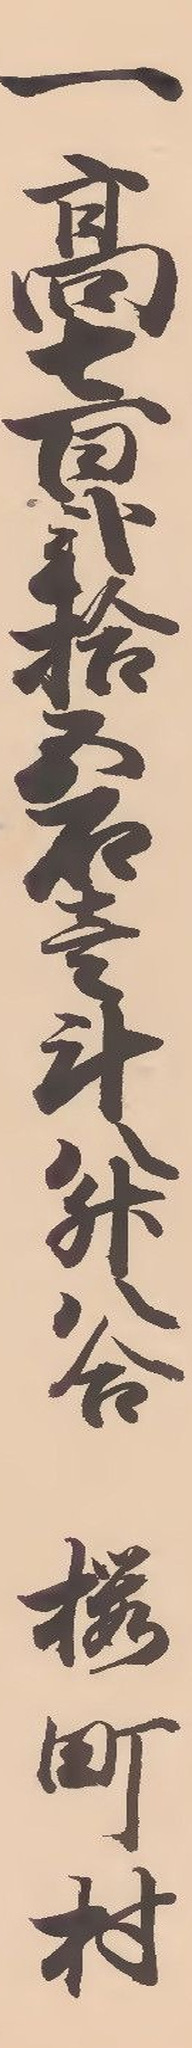一高七百弐拾五石壱斗八升八合桜町村
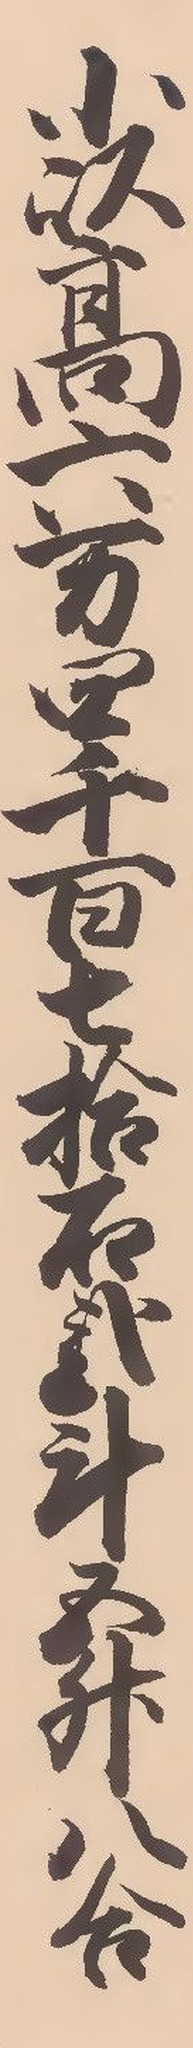小以高六万四千百七拾石弐斗五升八合

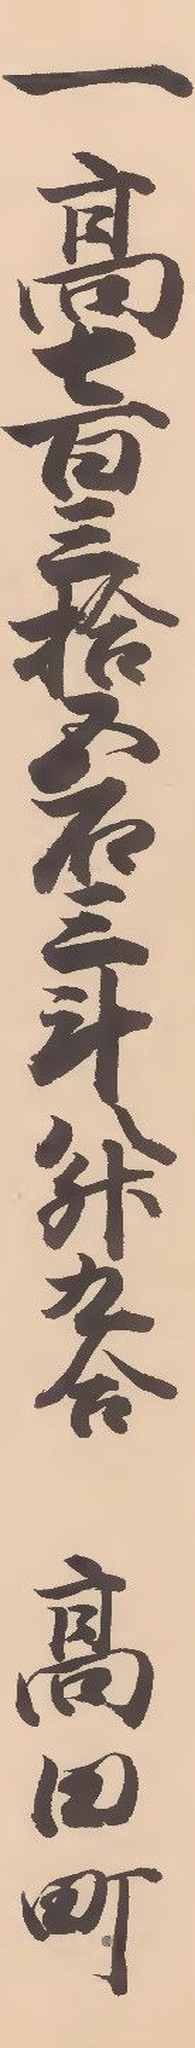一高七百三拾五石三斗八升九合高田町
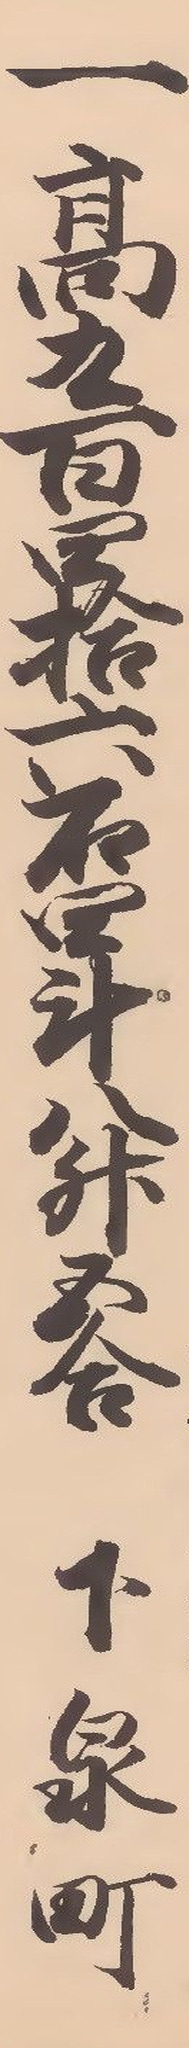一高九百四拾六石四斗八升五合下泉町
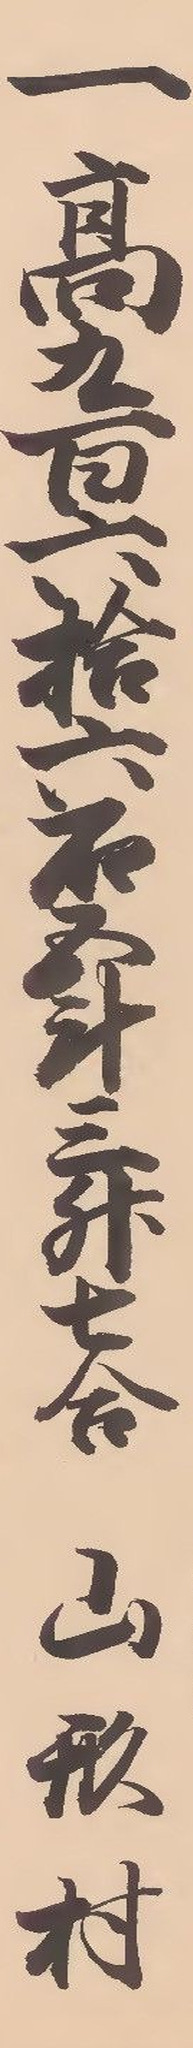一高九百六拾六石五斗三升七合山形村
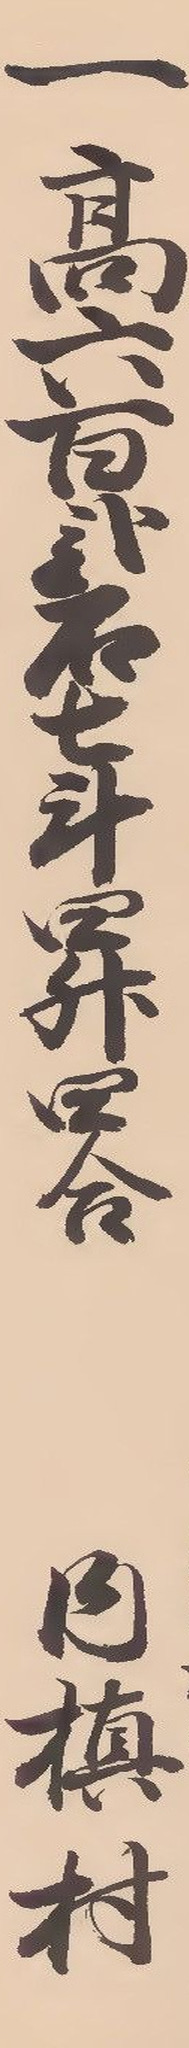一高六百弐石七斗四升四合内槙村
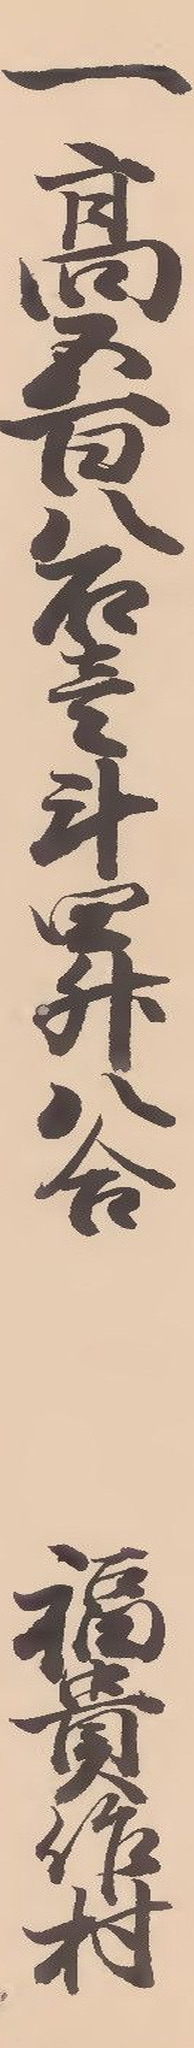一高五百八石壱斗四升八合福貴作村
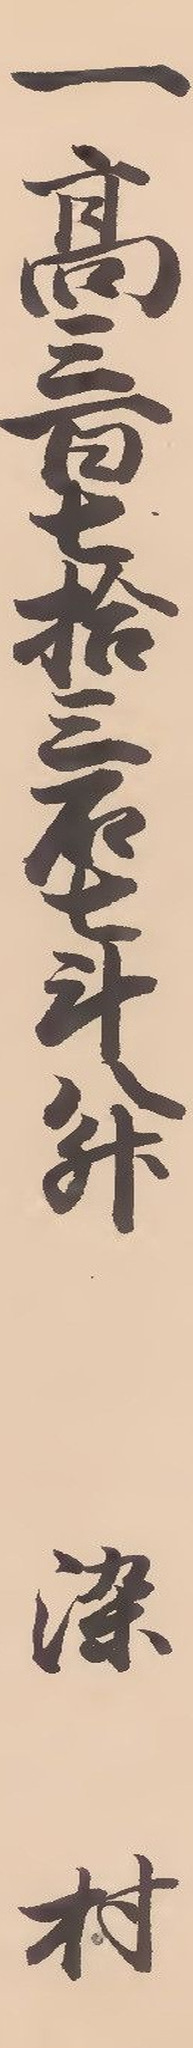一高三百七拾三石七斗八升染村
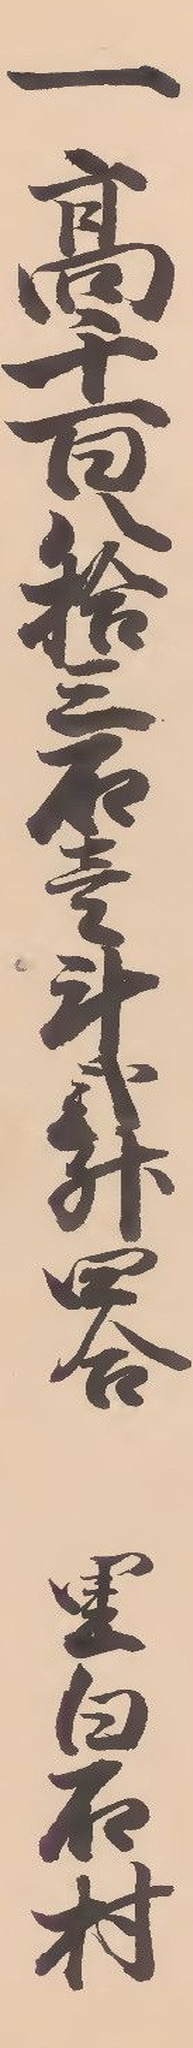一高千百八拾三石壱斗弐升四合里白石村

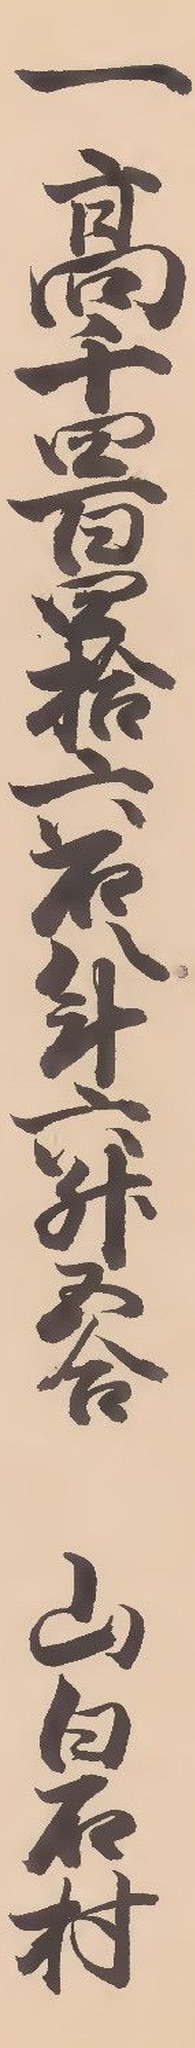一高千四百四拾六石八斗六升五合山白石村
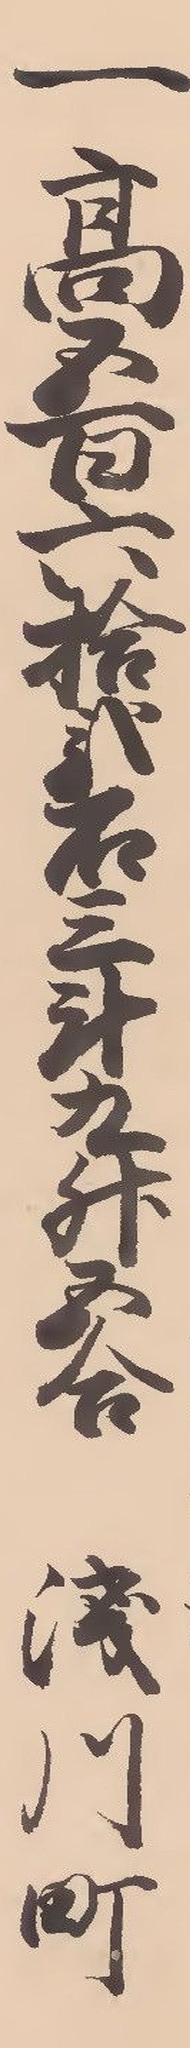一高五百六拾弐石三斗九升五合浅川町
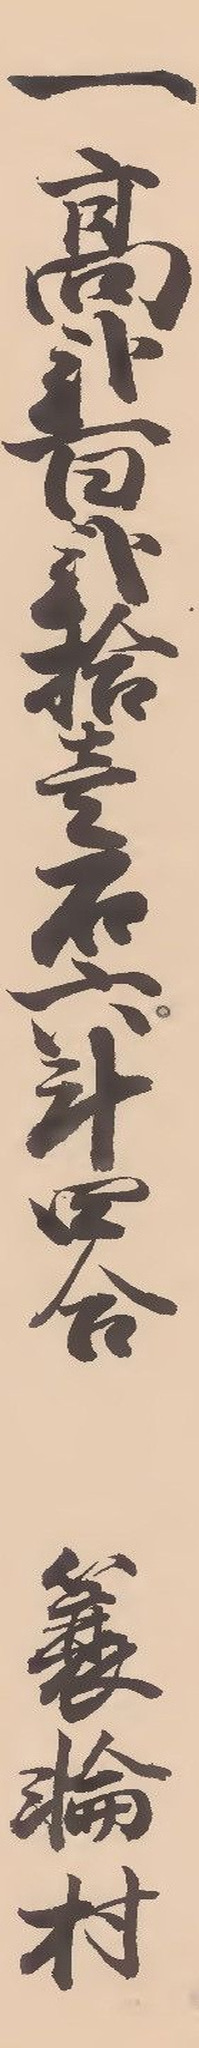一高弐百弐拾壱石六斗四合簑輪村
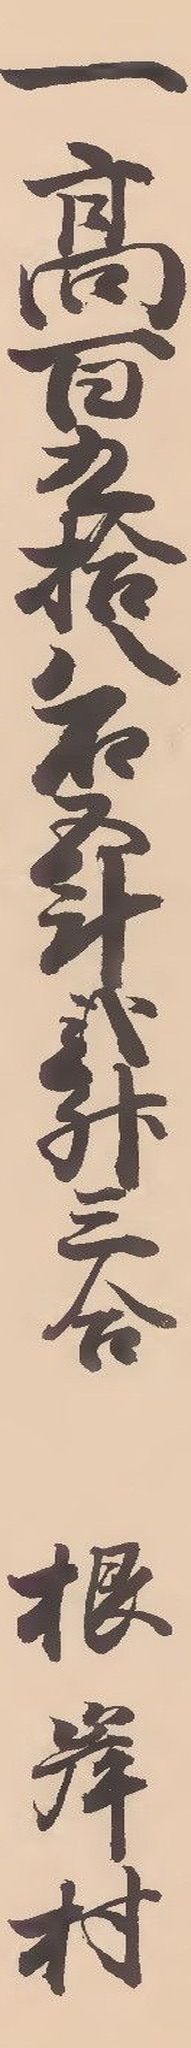一高百九拾八石五斗弐升三合根岸村
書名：陸奥国郷帳　２
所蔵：国立公文書館 National Archives of Japan
